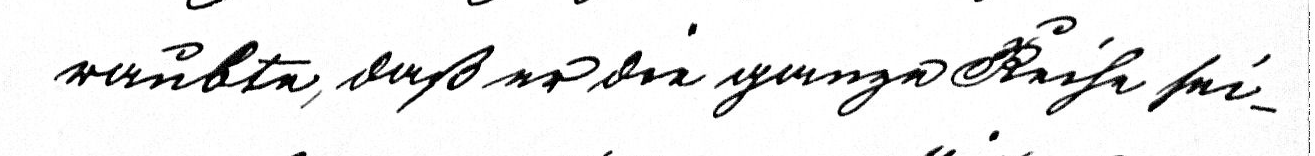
raubte, daß er die ganze Reihe sei¬
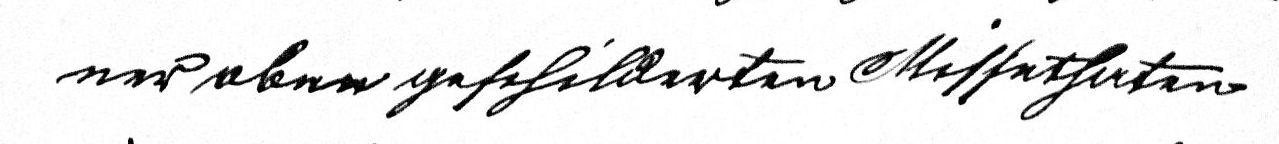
ner oben geschilderten Missethaten
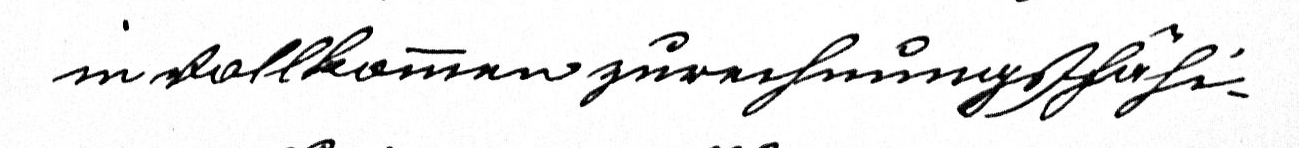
in vollkommen zurechnungsfähi¬
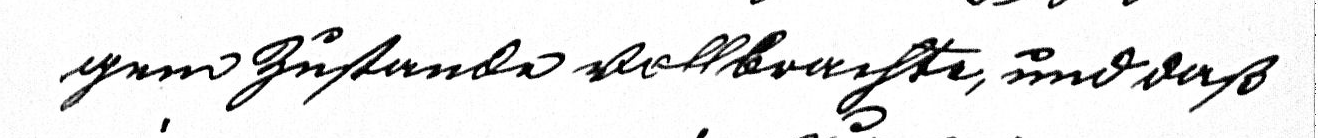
gen Zustande vollbrachte, und daß
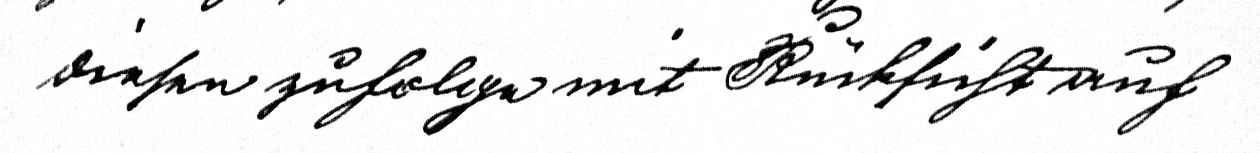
diesen zufolge mit Rücksicht auf
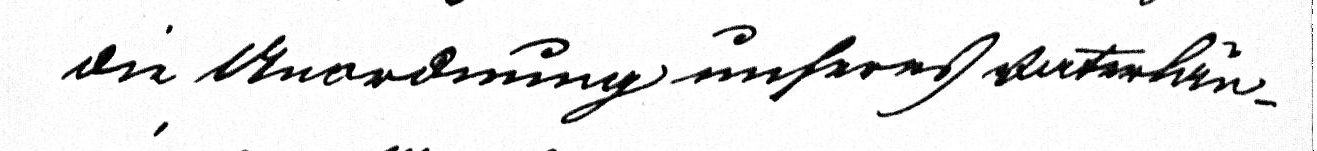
die Anordnung unseres vaterlän¬
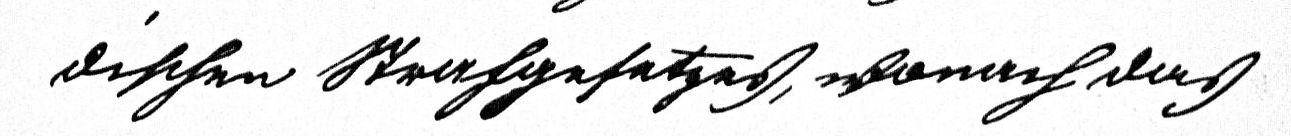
dischen Strafgesetzes, wonach das
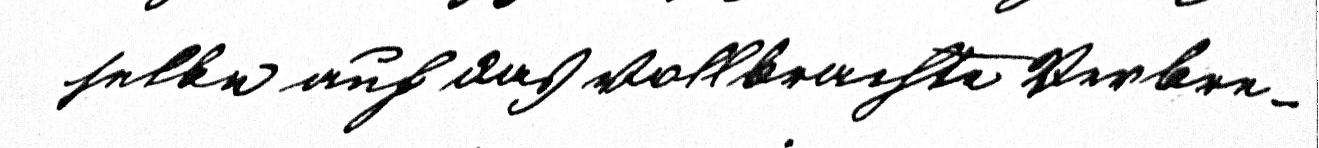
selbe auf das vollbrachte Verbre¬
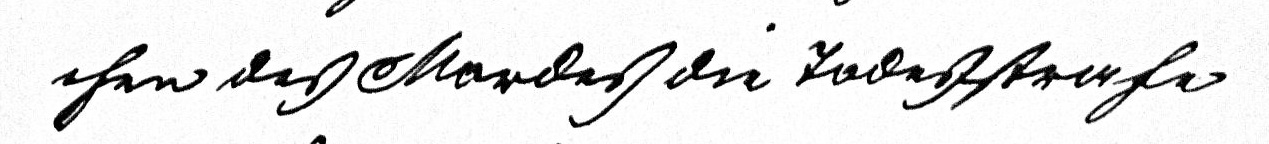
chen des Mordes die Todesstrafe
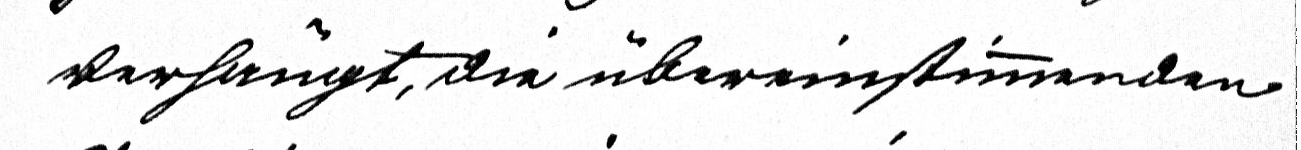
verhängt, die übereinstimmenden
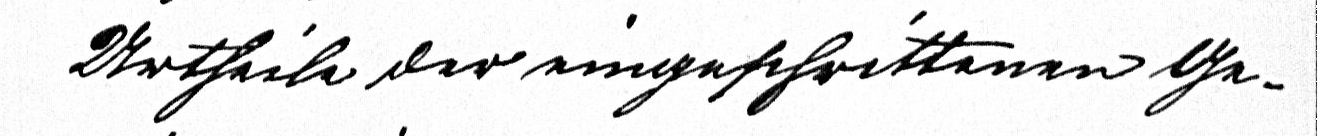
Urtheile der eingeschrittenen Ge¬
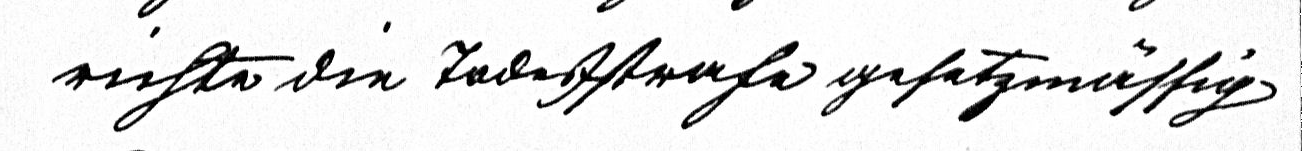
richte die Todesstrafe gesetzmässig
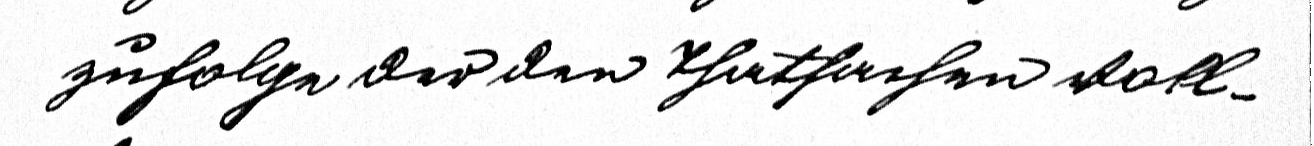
zufolge der den Thatsachen voll¬
